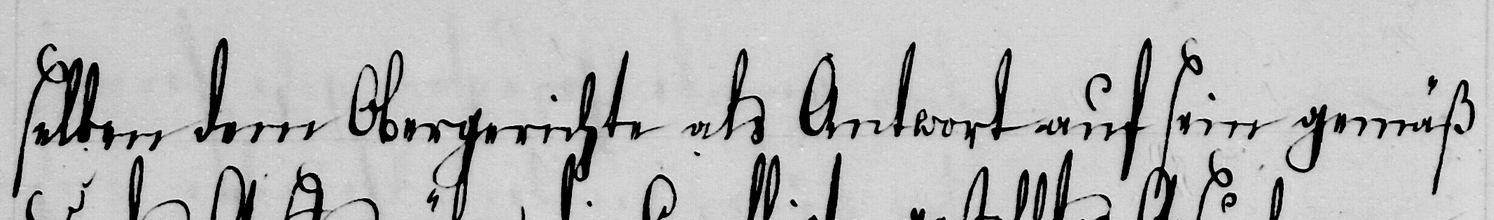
selben dem Obergerichte als Antwort auf sein gemäß
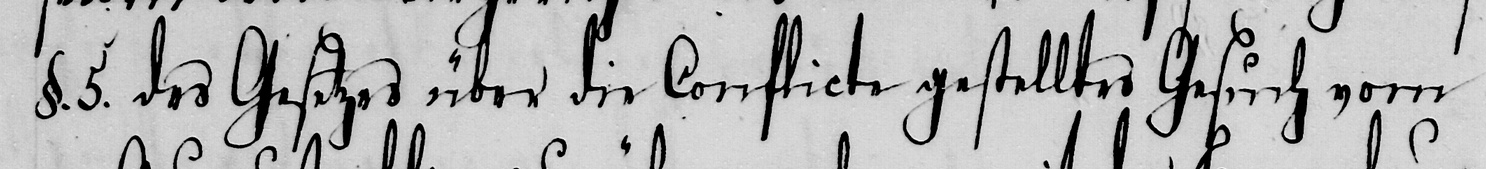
§. 5. des Gesetzes über die Conflicte gestelltes Gesuch vom
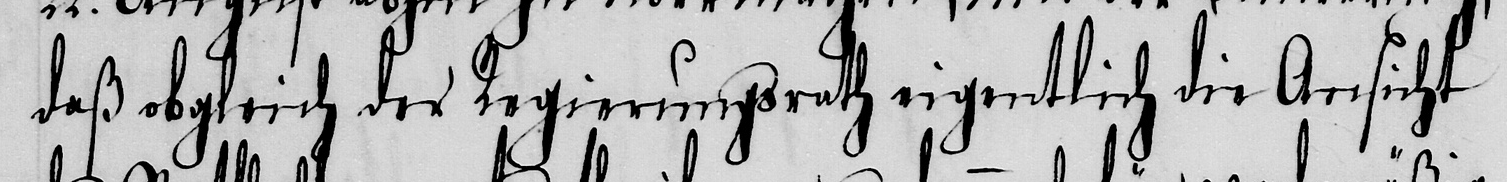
daß obgleich der Regierungsrath eigentlich die Ansicht
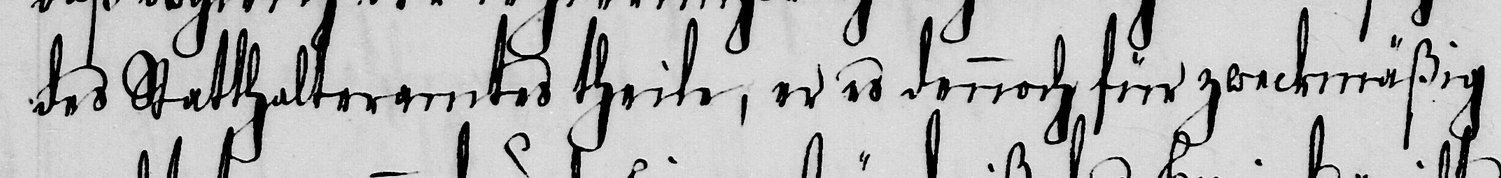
des Statthalteramtes theile, er es dennoch für zweckmäßig
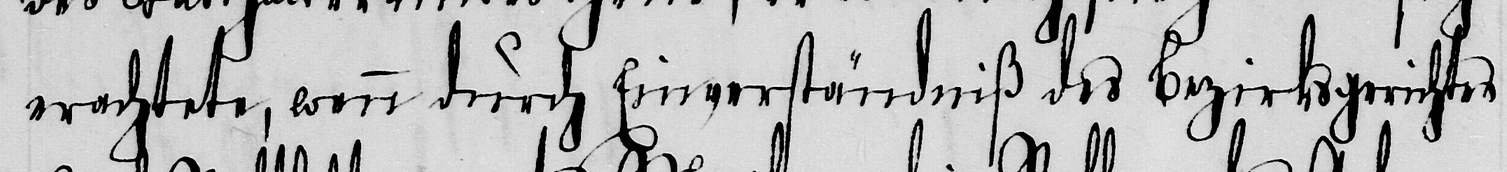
erachtete, wenn durch Einverständniß des Bezirksgerichtes
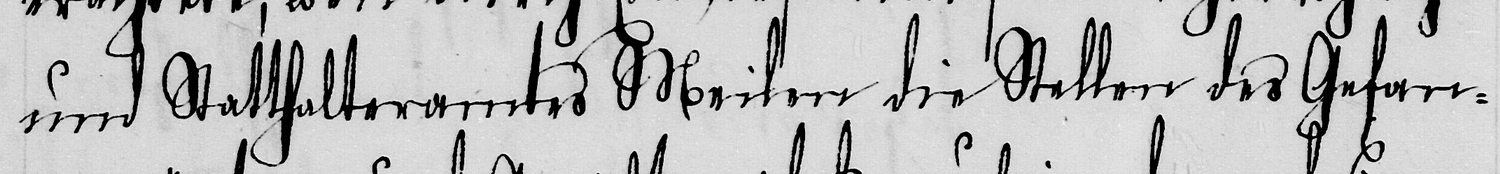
und Statthalteramtes meilen die Stellen des Gefan¬
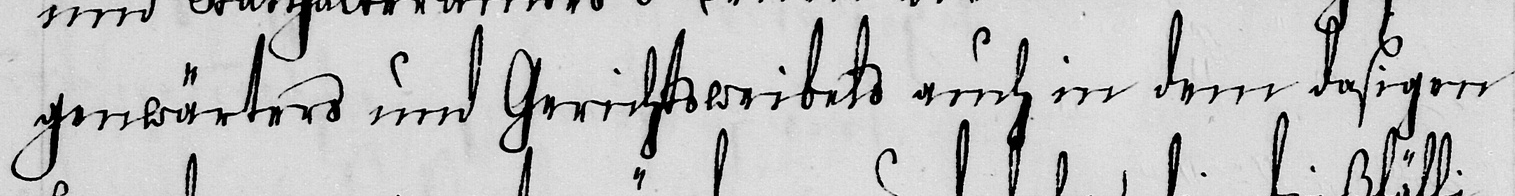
genwärters und Gerichtsweibels auch in dem dasigen
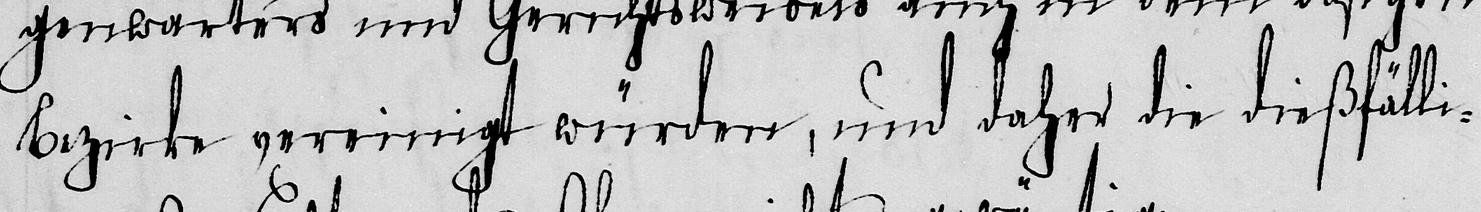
Bezirke vereinigt würden, und daher die dießfäll¬
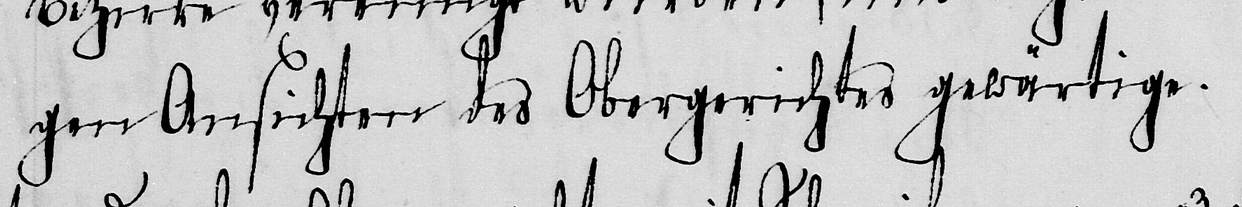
igen Ansichten des Obergerichtes gewärtige.
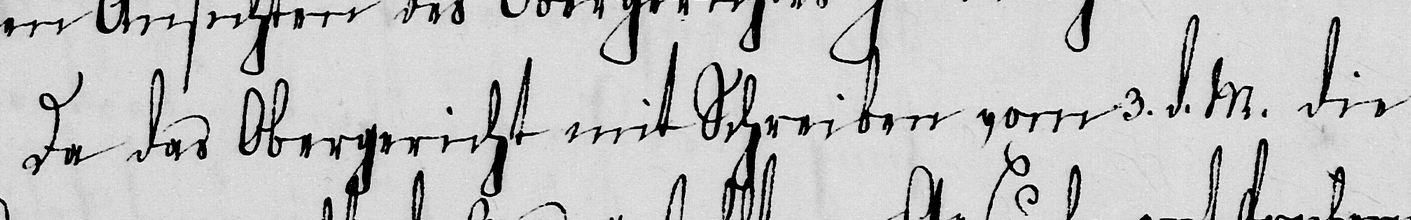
Da das Obergericht mit Schreiben vom 3. d. M. die
